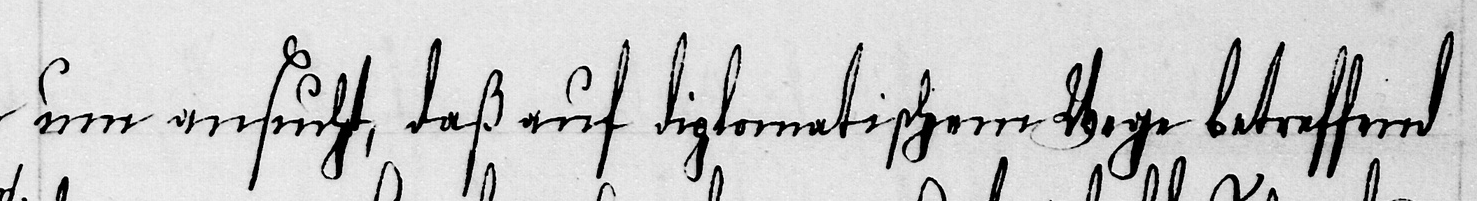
um ansucht, daß auf diplomatischem Wege betreffend
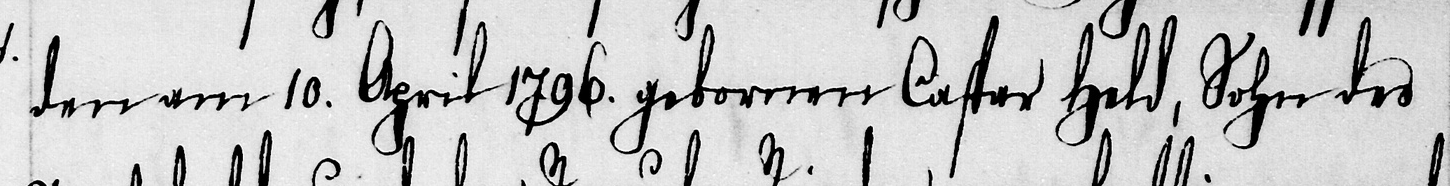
den am 10. April 1796. gebornen Caspar Held, Sohn des
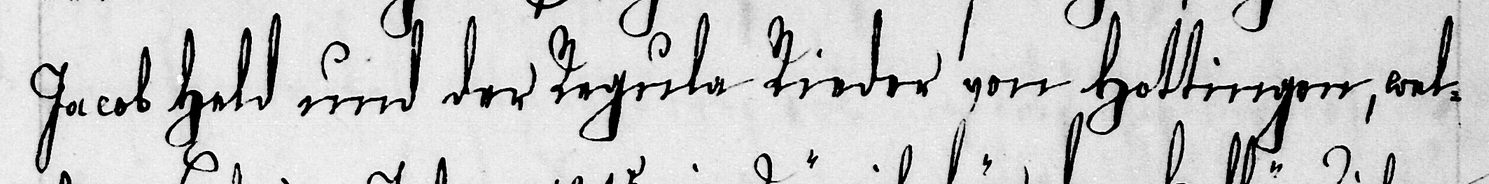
Jacob Held und der Regula Rieder von Hottingen, wel¬
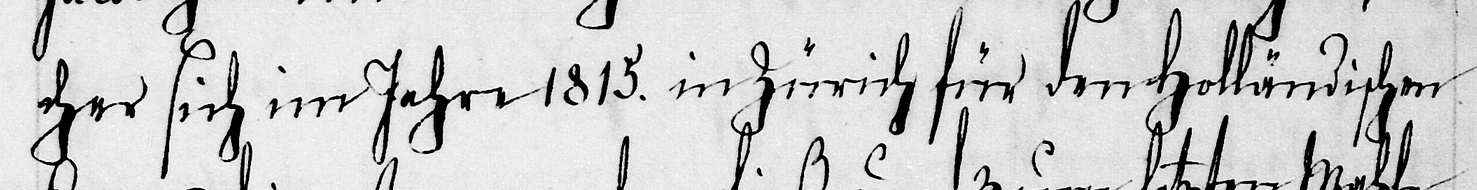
cher sich im Jahre 1815. in Zürich für den Holländischen
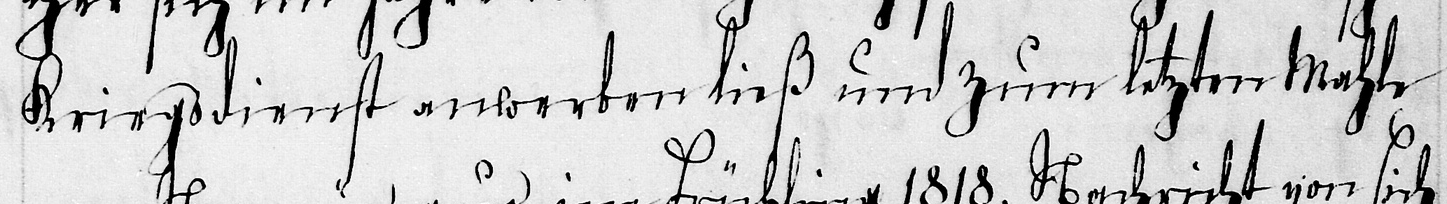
Kriegsdienst anwerben ließ und zum letzten Mahle
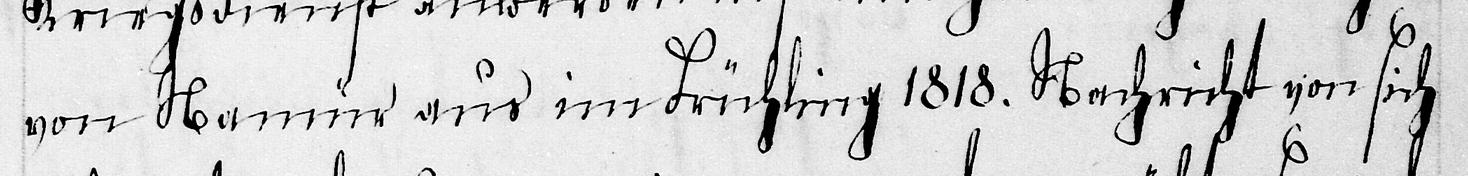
von Namür aus im Frühling 1818. Nachricht von sich
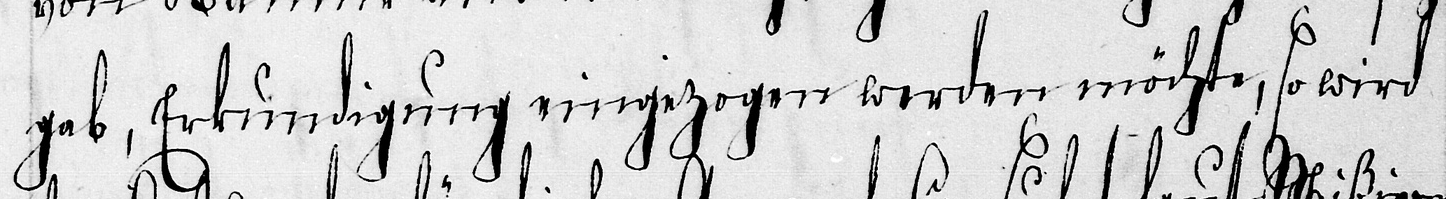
gab, Erkundigung eingezogen werden möchte, so wird
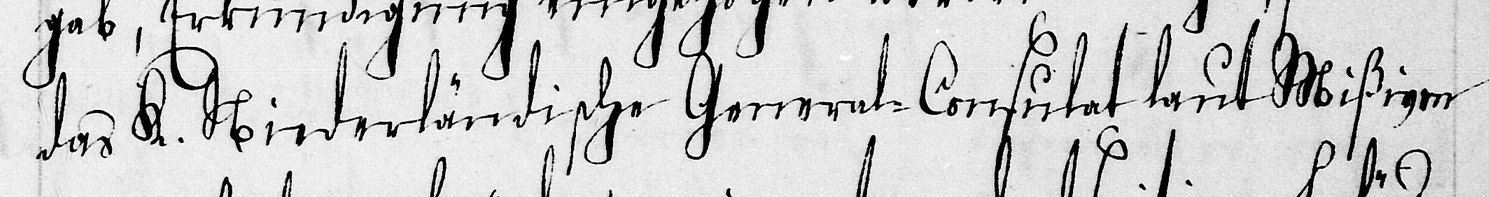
das K. Niederländische Gerenal-Consulat laut Mißiven
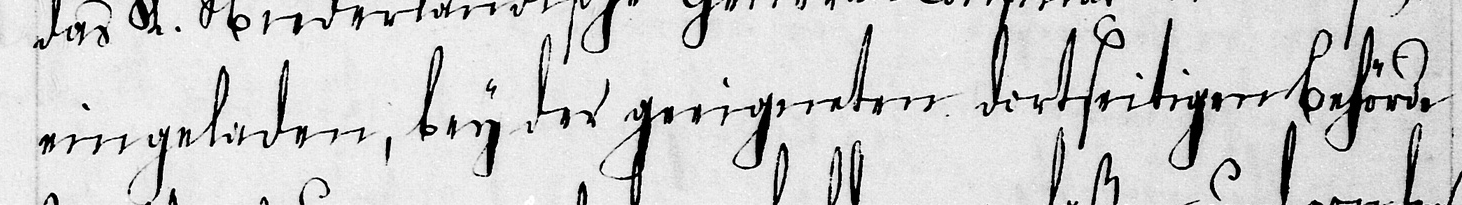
eingeladen, bey der geeigneten dortseitigen Behörde
